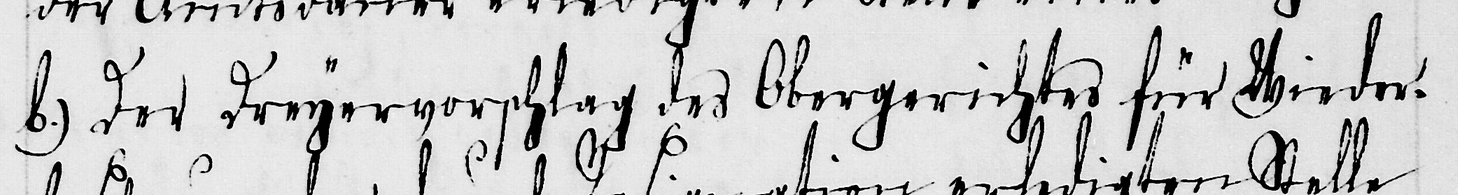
b.) Der Dreyervorschlag des Obergerichtes für Wieder¬
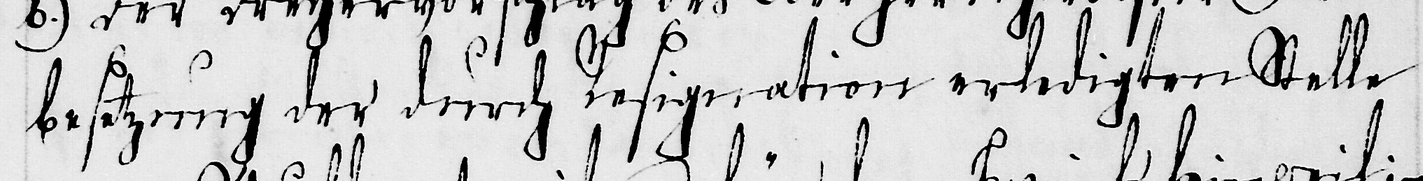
besetzung der durch Resignation erledigten Stelle
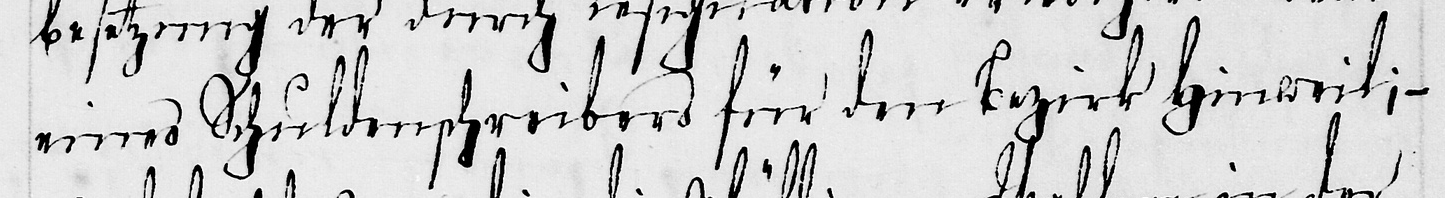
eines Schuldenschreibers für den Bezirk Hinweil; –
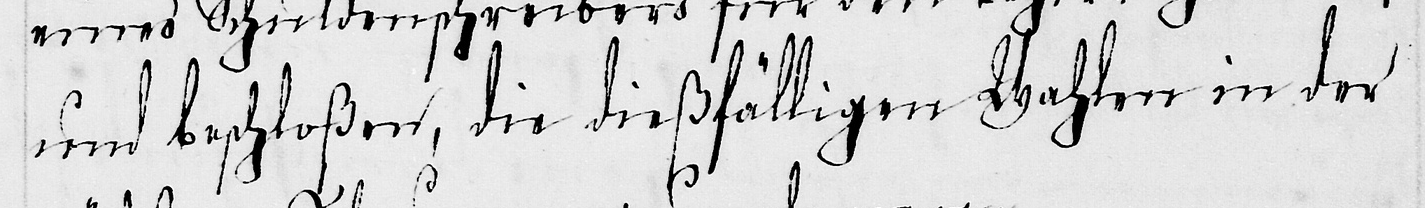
und beschloßen, die dießfälligen Wahlen in der
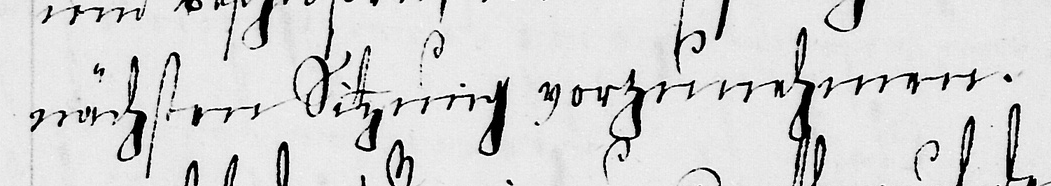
nächsten Sitzung vorzunehmen.
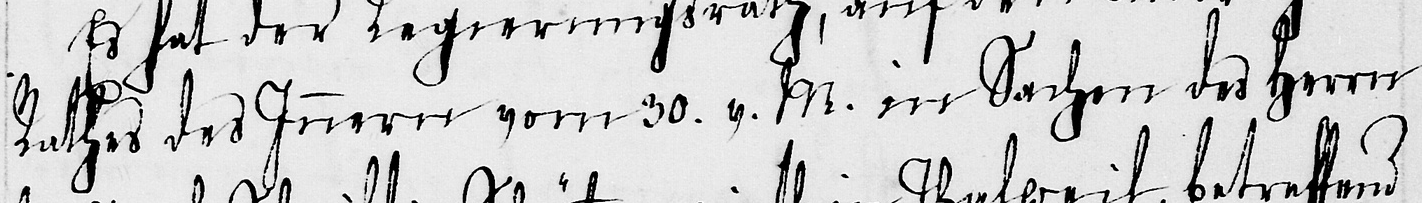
Rathes des Innern vom 30. v. M. in Sachen des Herrn
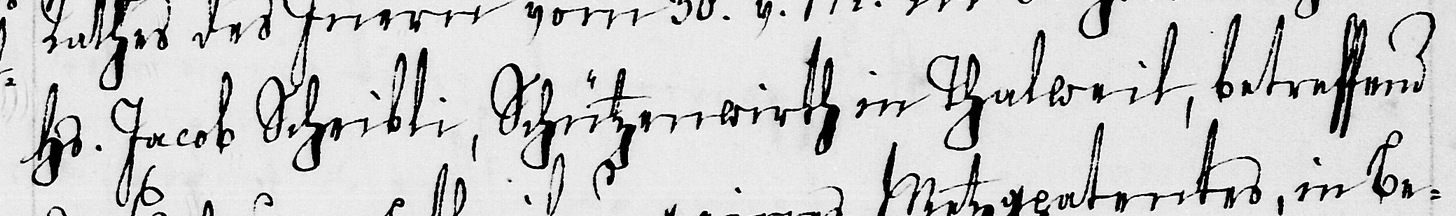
Hs. Jacob Scheibli, Schützenwirth in Thalweil, betreffend
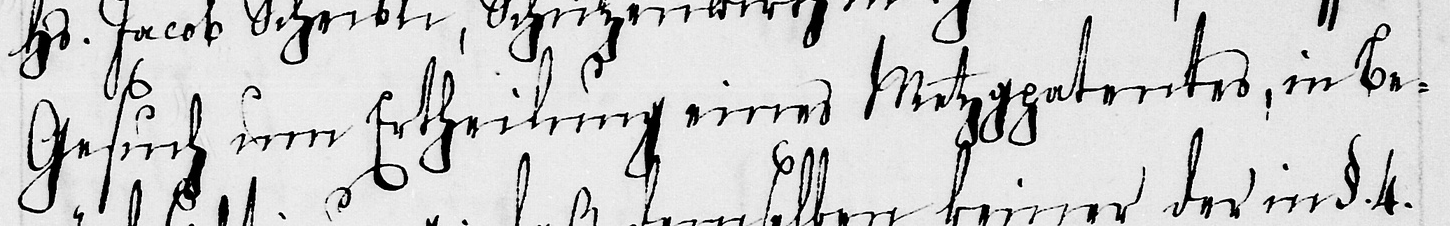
Gesuch um Ertheilung eines Metzgpatentes, in Be¬
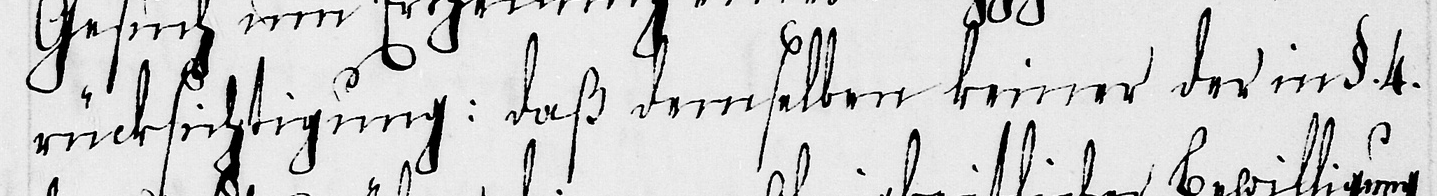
rücksichtigung: daß demselben keiner der in §. 4.
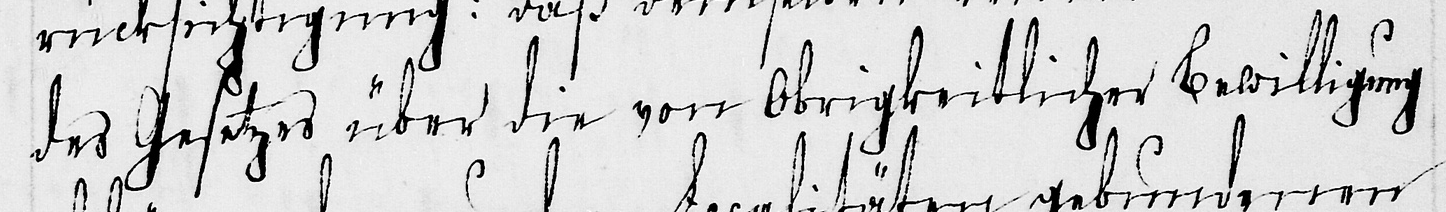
des Gesetzes über die von Obrigkeitlicher Bewilligung
